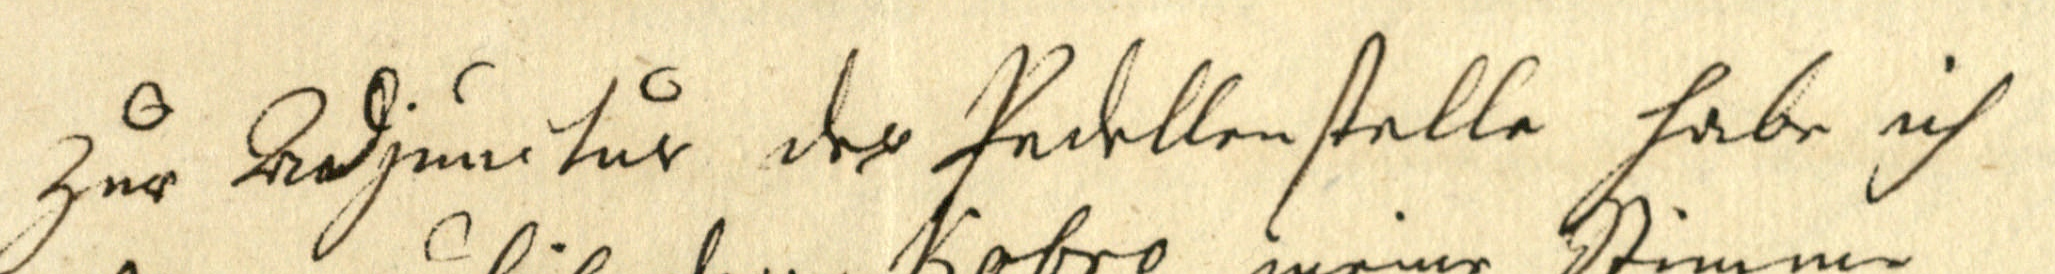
Zur Adjunctur der Pedellenstelle habe ich
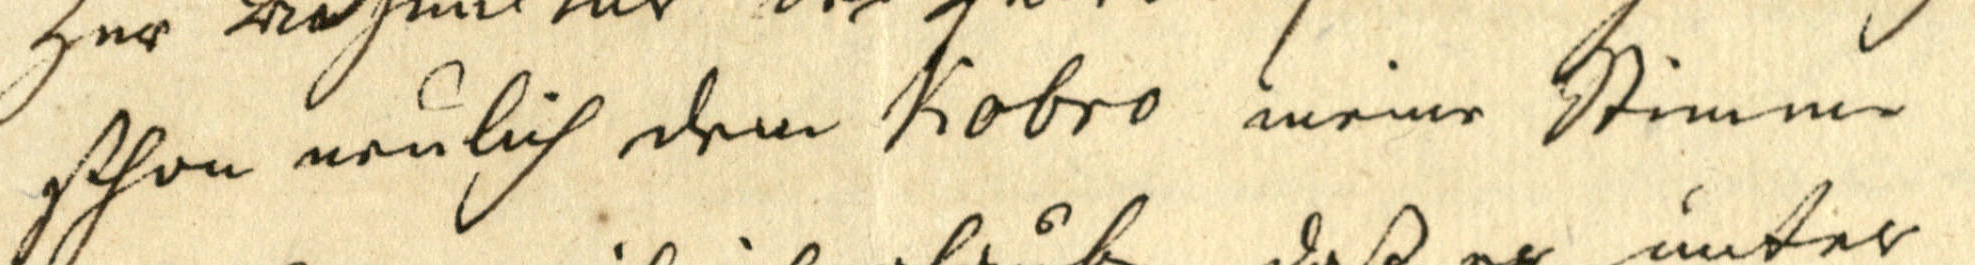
schon neulich dem Kobro neue Stimme
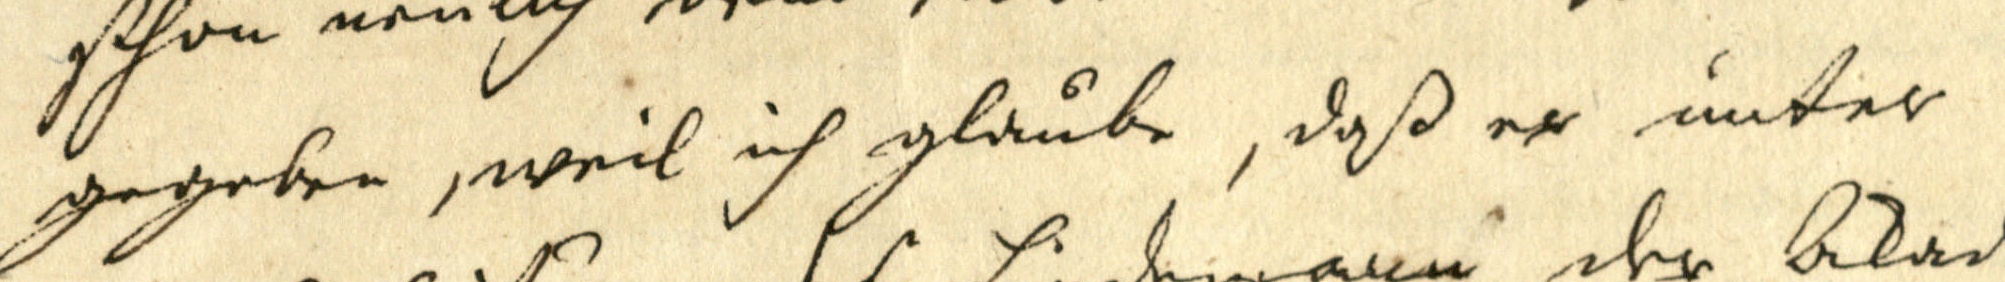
gegeben, weil ich glaube, daß er unter
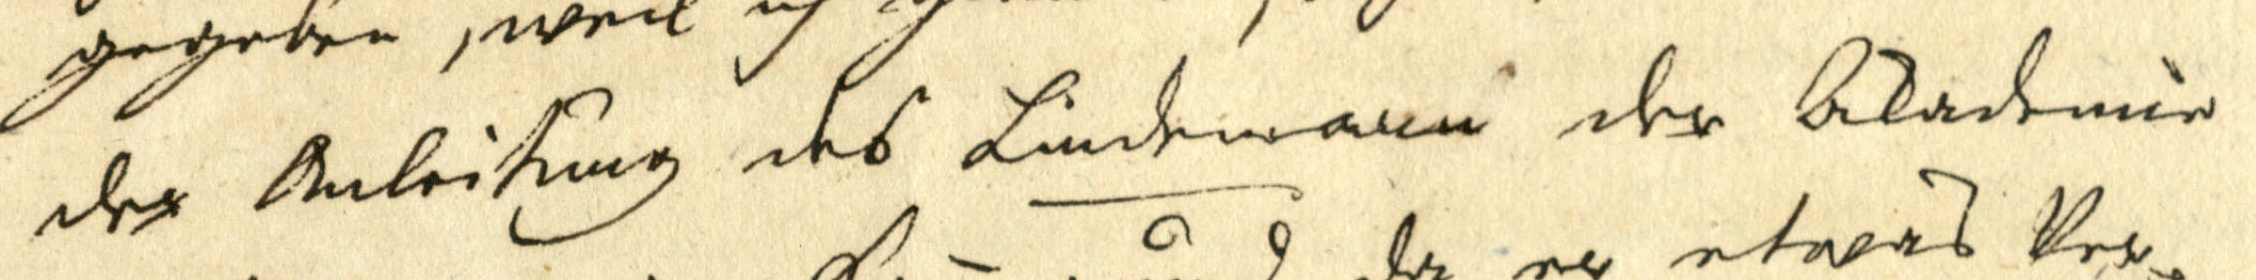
der Anleitung des Lindemann der Academie
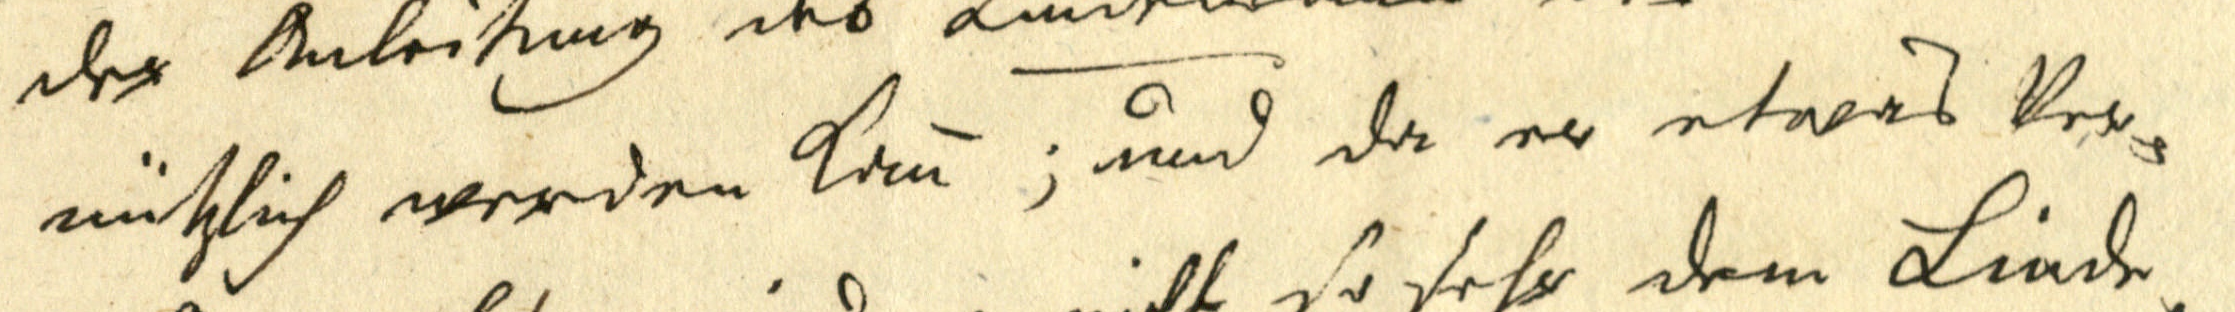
nützlich werden kan; und da er etwas Ver¬
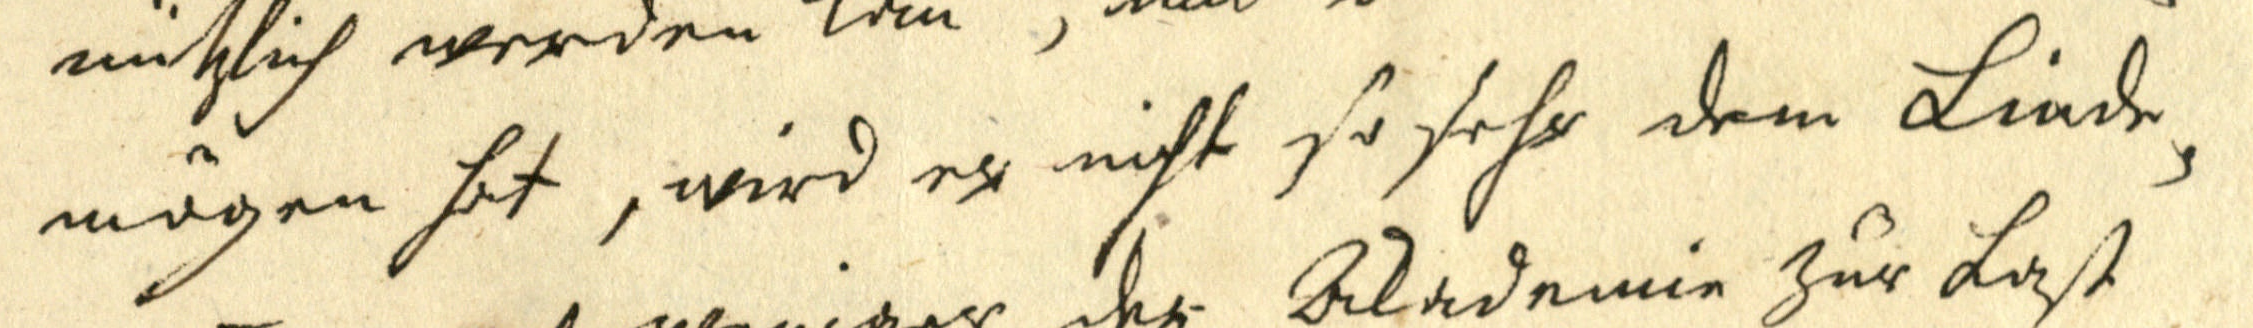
mögen hat, wird er nicht so sehr dem Linde¬
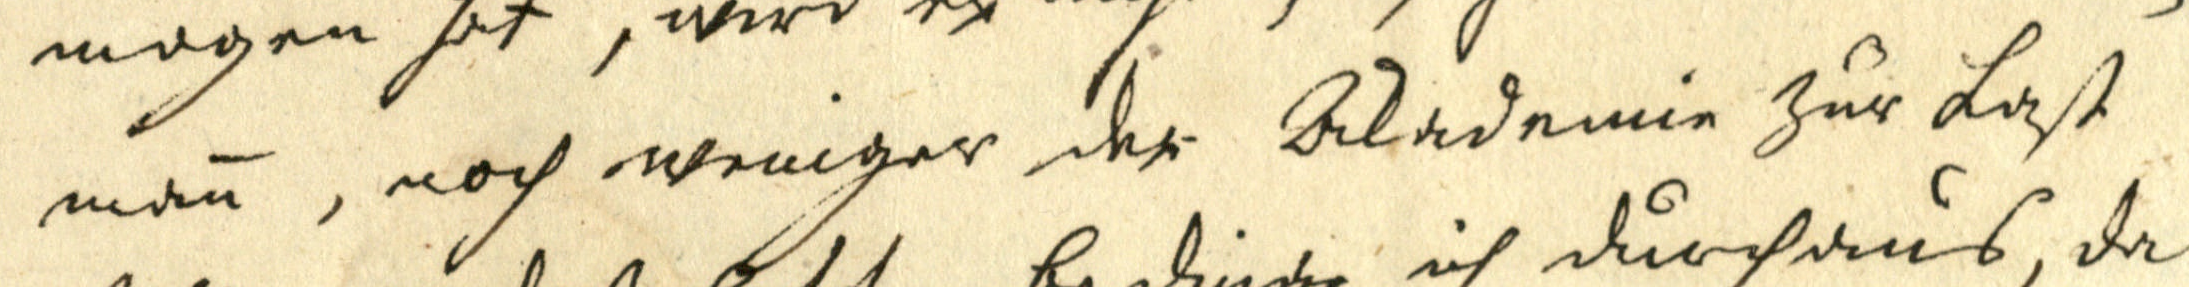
man, noch weniger der Akademie zur Last
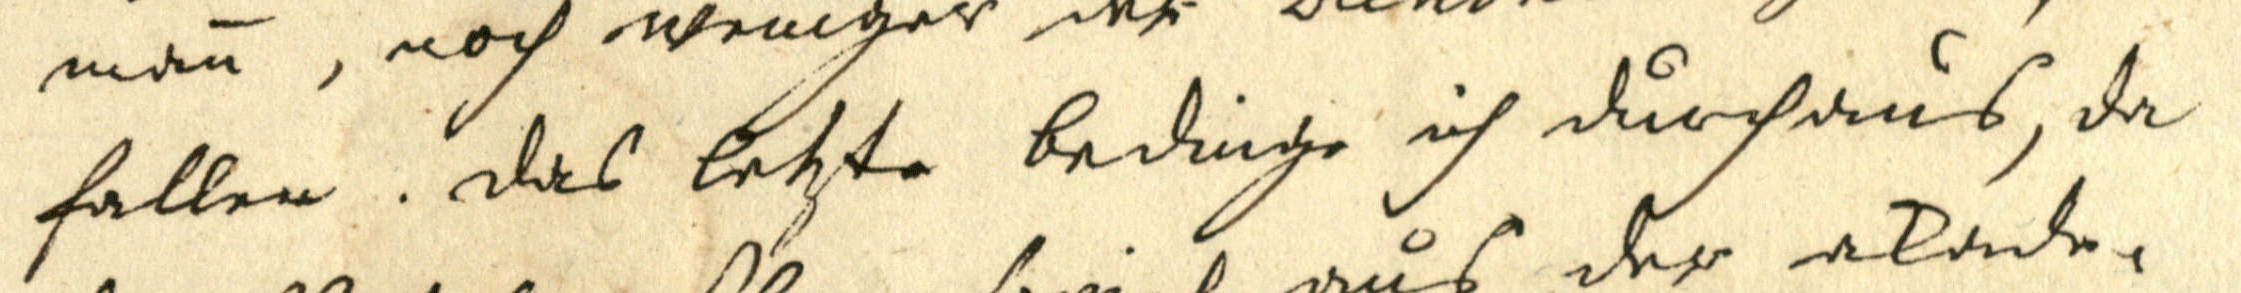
fallen. Das letzte bedinge ich durchaus, da
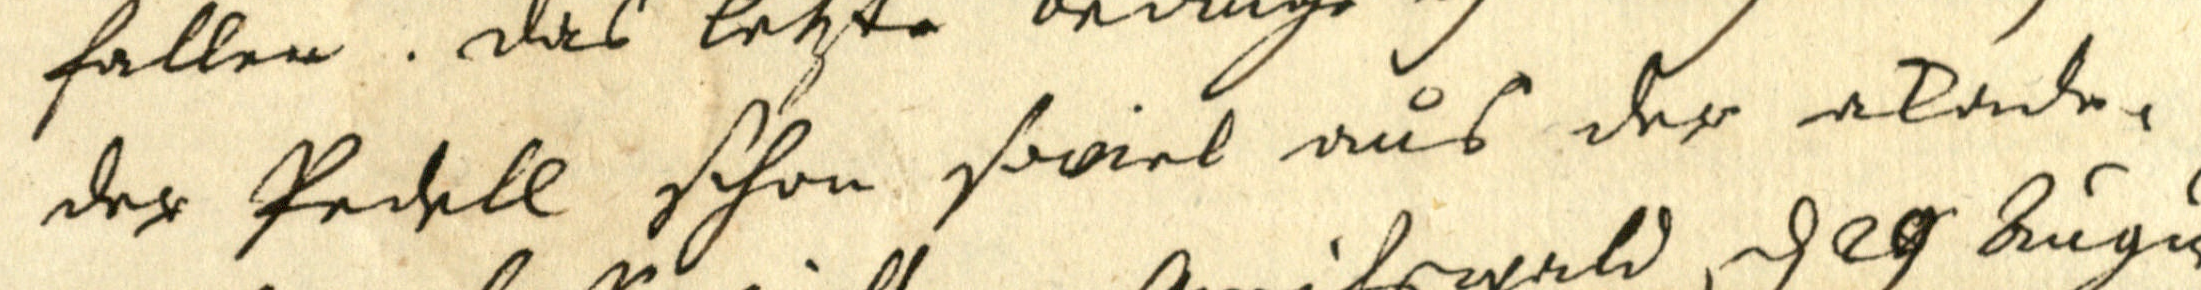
der Pedell schon soviel aus der akade¬
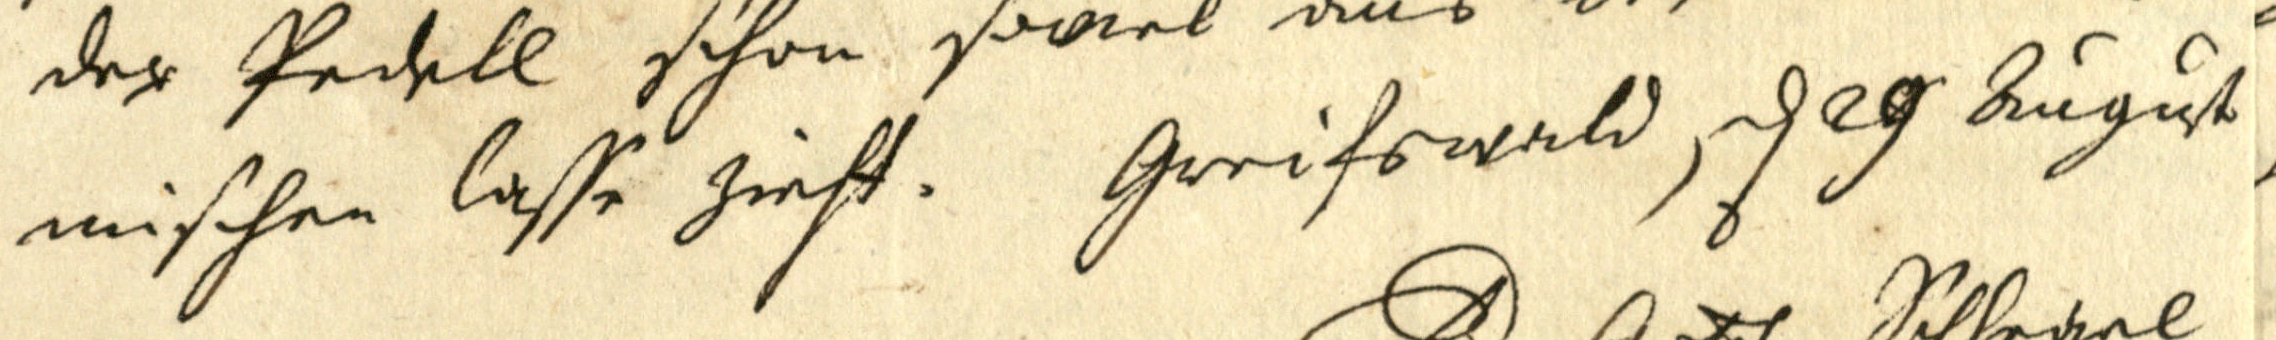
mischen Casse zieht. Greifswald d 29 August
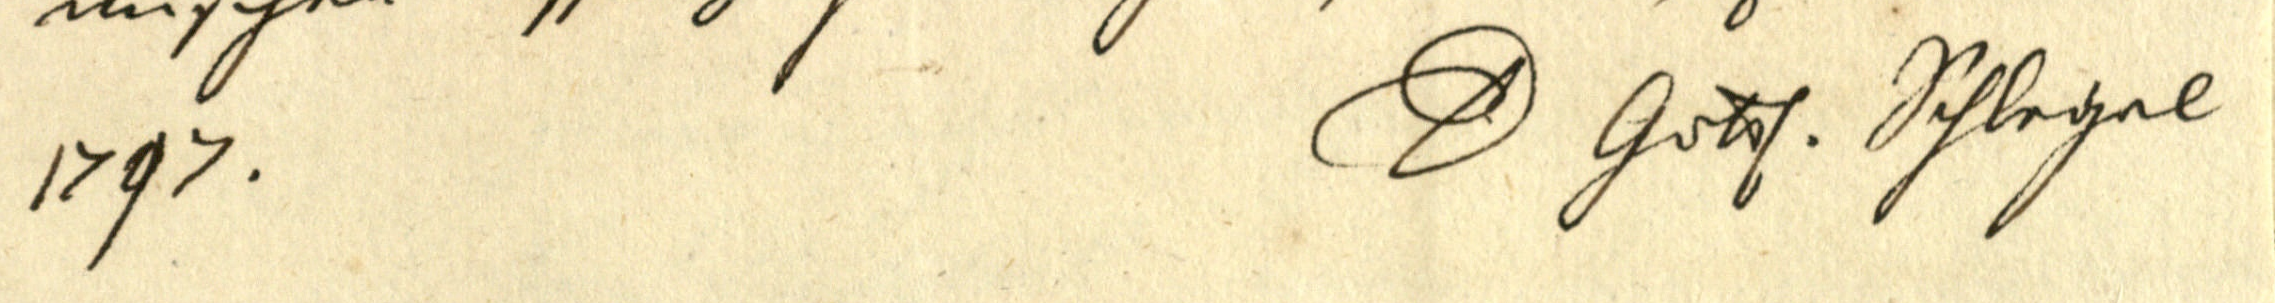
1797 D Gottl. Schlegel
